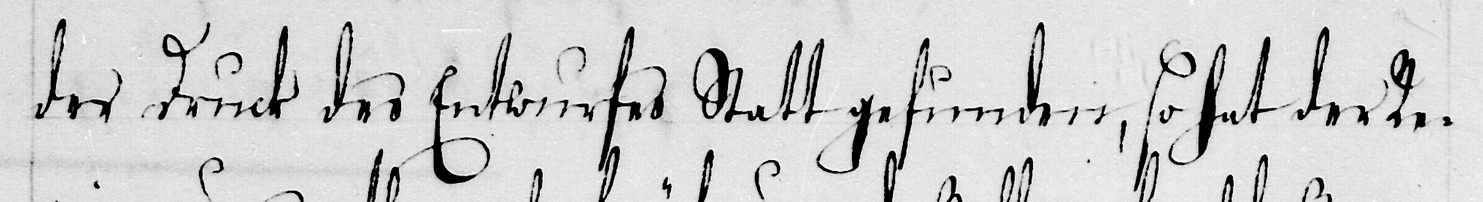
der Druck des Entwurfes Statt gefunden, so hat der Re¬
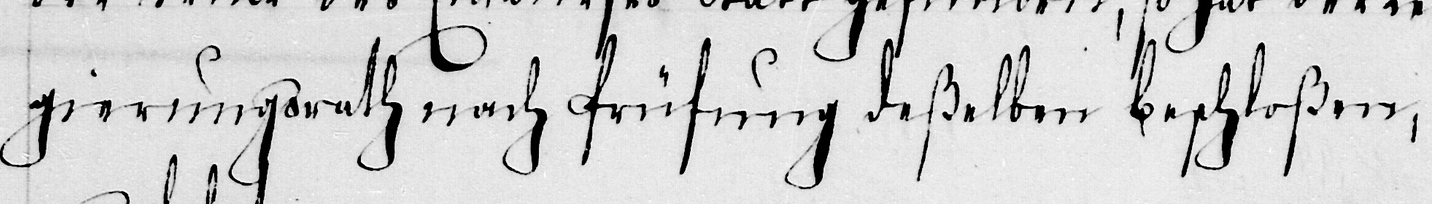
gierungsrath nach Prüfung deßelben beschloßen,
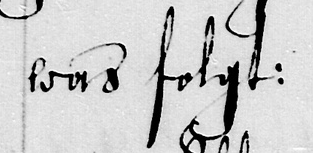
was folgt:
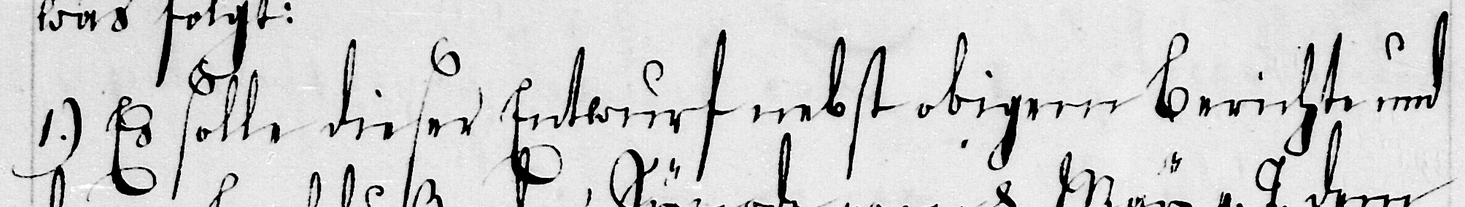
1.) Es solle dieser Entwurf nebst obigem Berichte und
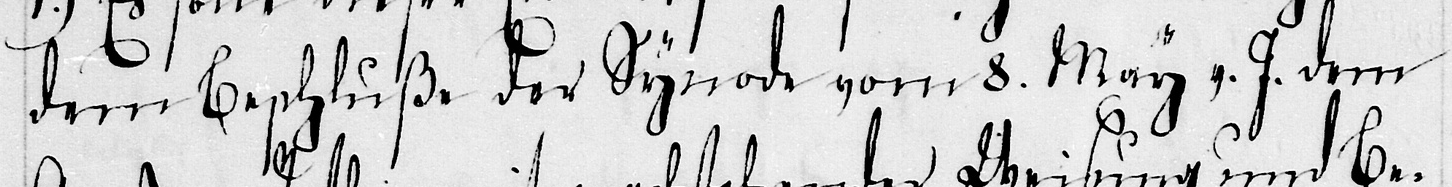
dem Beschluße der Synode vom 8. May v. J. dem
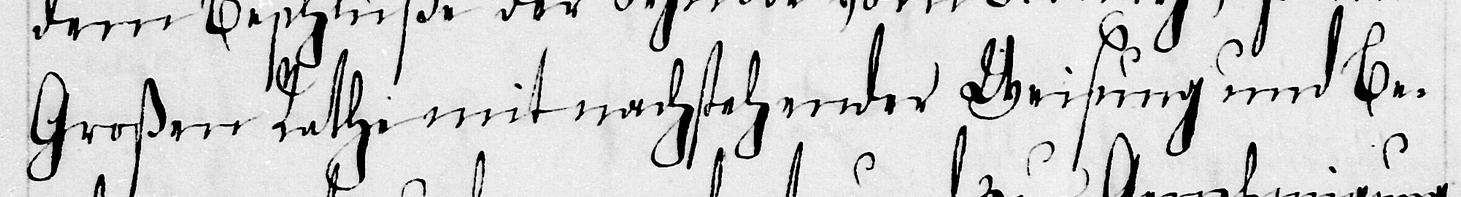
Großen Rathe mit nachstehender Weisung und Be¬
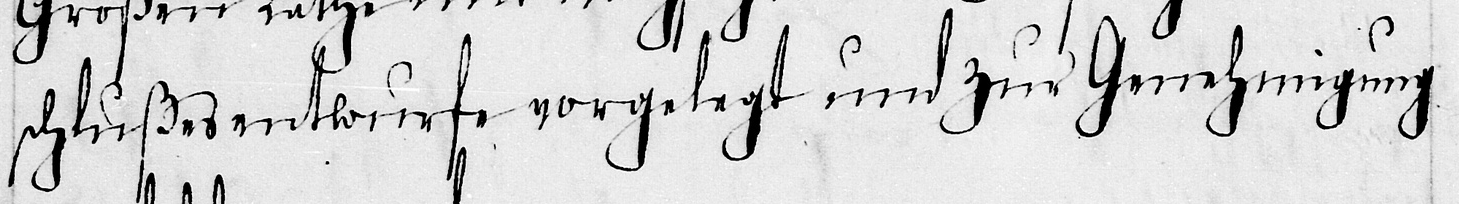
schlußentwurfe vorgelegt und zur Genehmigung
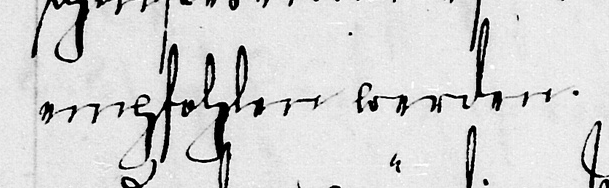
empfohlen werden.
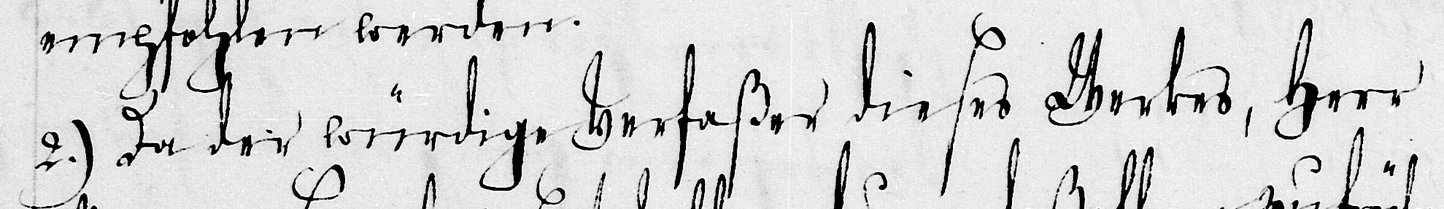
2.) Da der würdige Verfaßer dieses Werkes, Herr
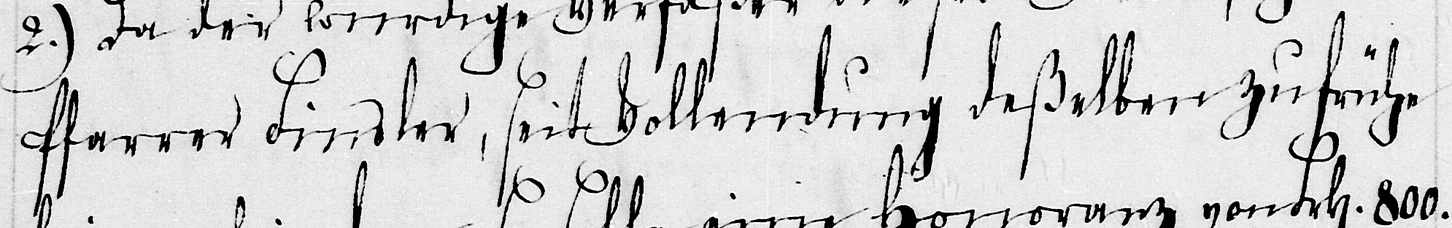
Pfarrer Finsler, seit Vollendung deßelben zu frühe
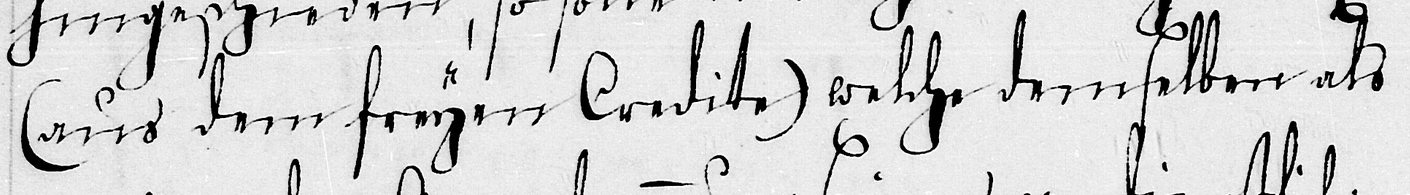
(aus dem freyen Credite) welche demselben als
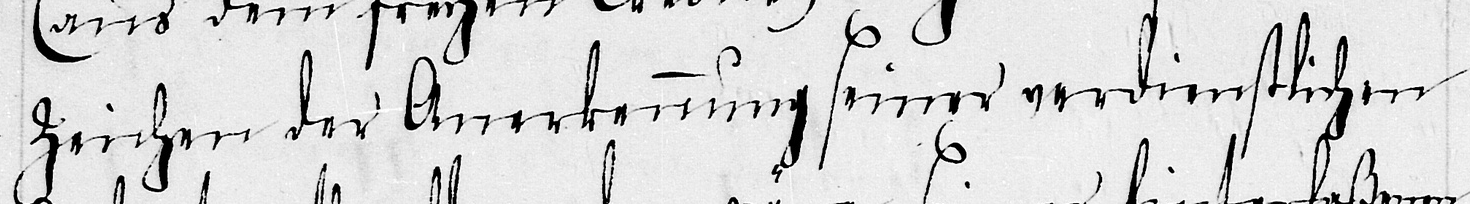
Zeichen der Anerkennung seiner verdienstlichen
